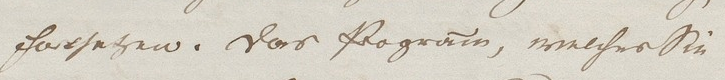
fortsetzen. Das Programm, welches Sie
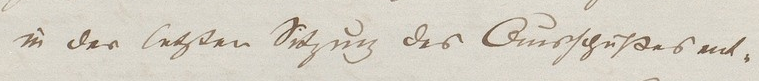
in der letzten Sitzung des Ausschußes ent-
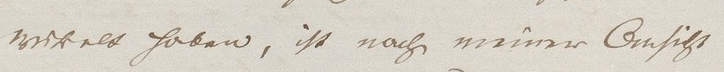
wikelt haben, ist nach meiner Ansicht
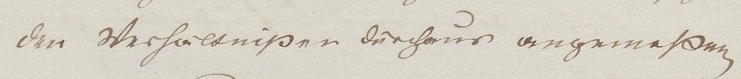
den Verhältnißen durchaus angemeßen
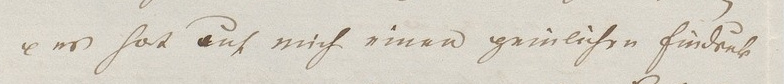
& es hat auf mich einen peinlichen Eindruk
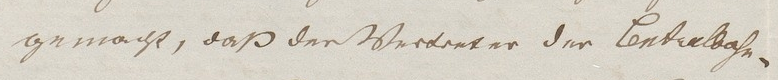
gemacht, daß der Vertreter der Centralbahn,
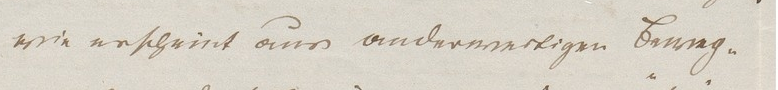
wie es scheint aus anderweitigen Beweg-
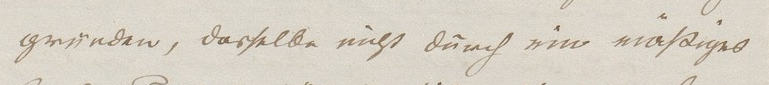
gründen, dasselbe nicht durch ein mäßiges
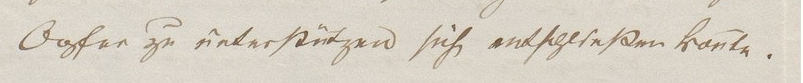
Opfer zu unterstützen sich entschließen konnte.
